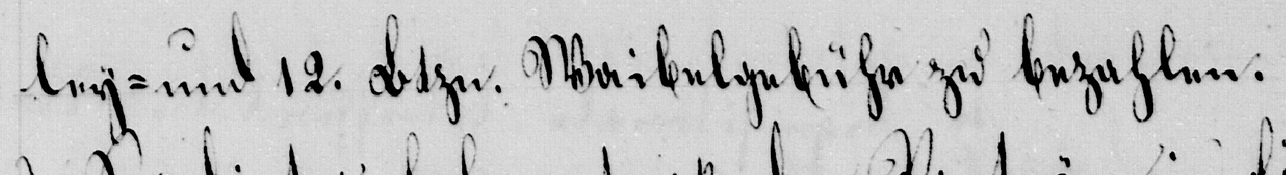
ley- und 12. Btzn. Waibelgebühr zu bezahlen.
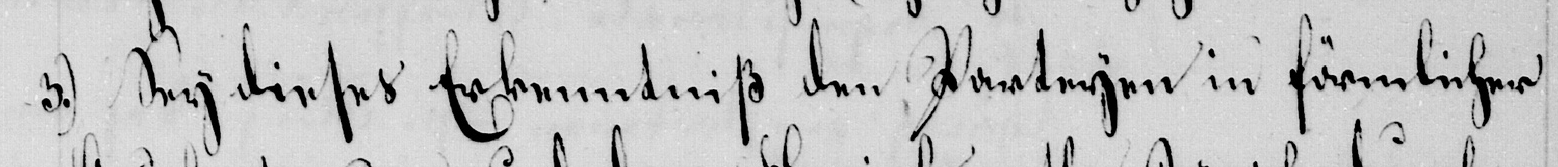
3.) Sey dieses Erkenntniß den Parteyen in förmlicher
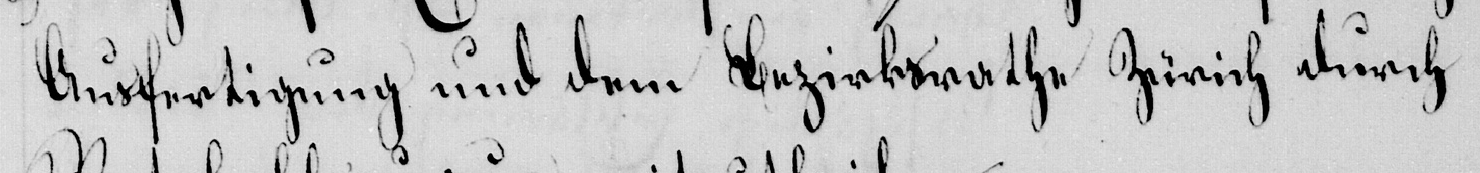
Ausfertigung und dem Bezirksrathe Zürich durch
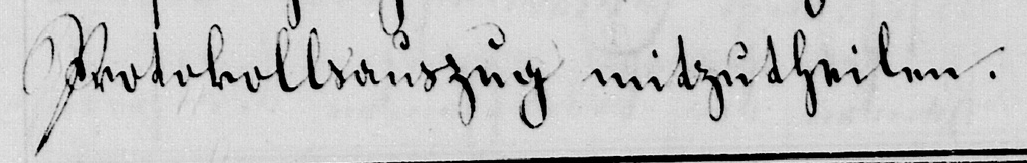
Protokollsauszug mitzutheilen.
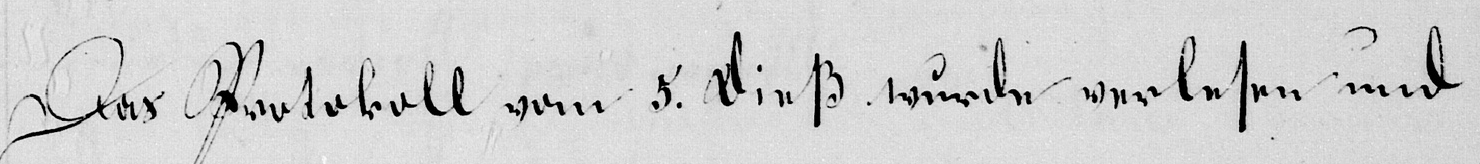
Das Protokoll vom 5. dieß. wurde verlesen und
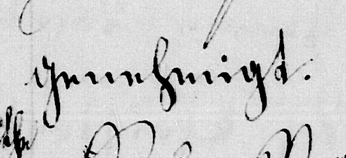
genehmigt.
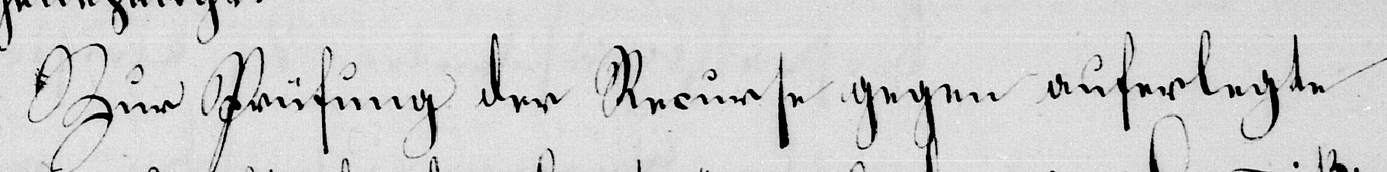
Zur Prüfung der Recurse gegen auferlegte
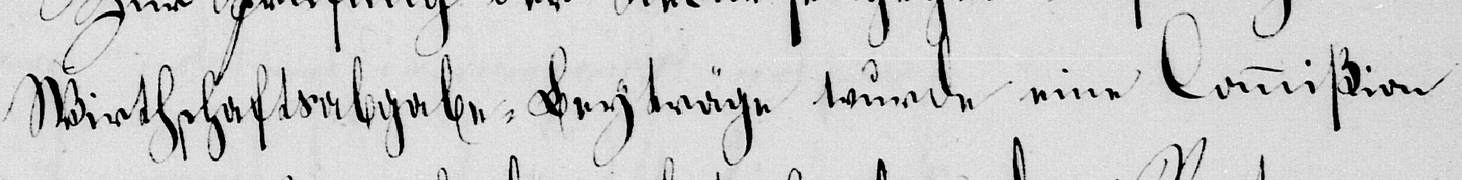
Wirthschaftsabgabe-Beyträge wurde eine Commißion
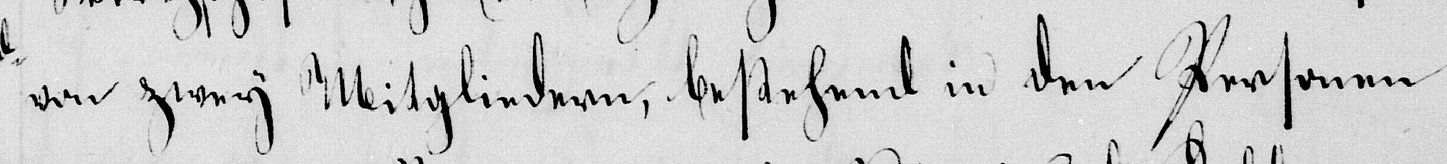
von zwey Mitgliedern, bestehend in den Personen
